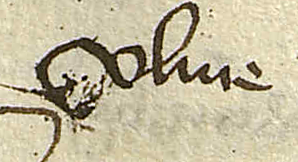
vlme
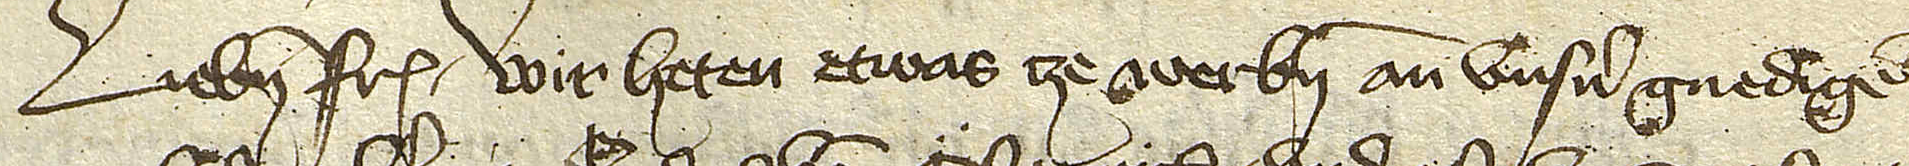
Liebn* fr* / Wir heten etwas cʒe werbn* an vnſn* gnedige*
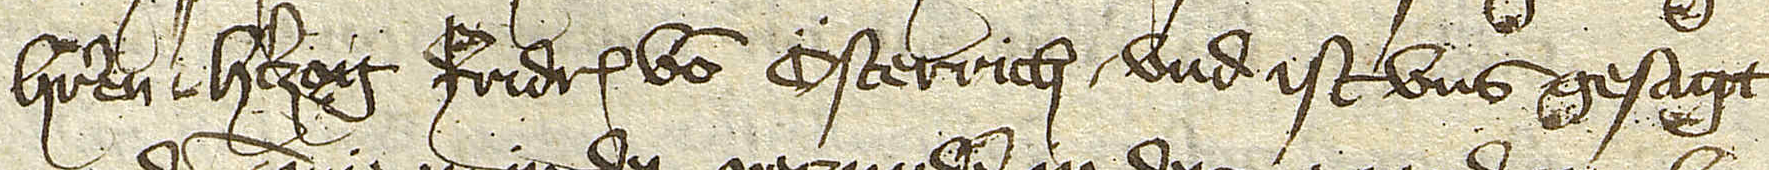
hr*en h*cʒog Fridr* Öſterrich / vnd iſt vns geſagt
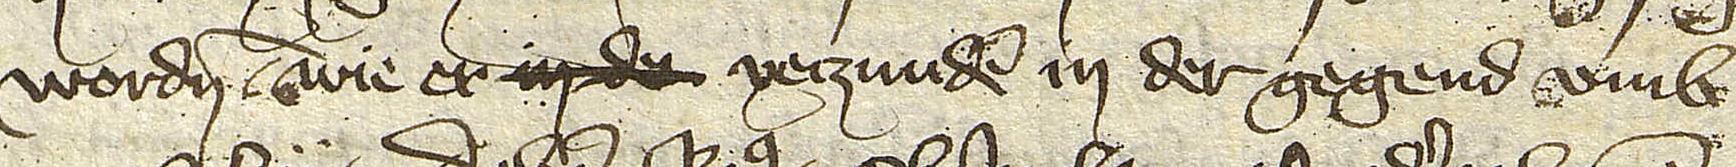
wordn* / wie er in der yecʒunde* in der gegend vmb
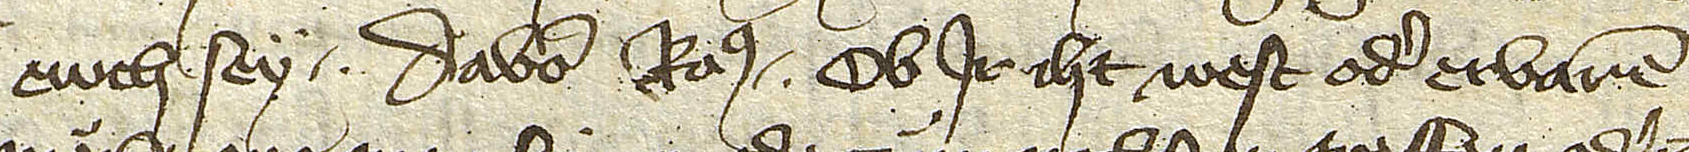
ewch ſey / . Davo* Ro* / . Ob Ir iht weſt od* ervare*
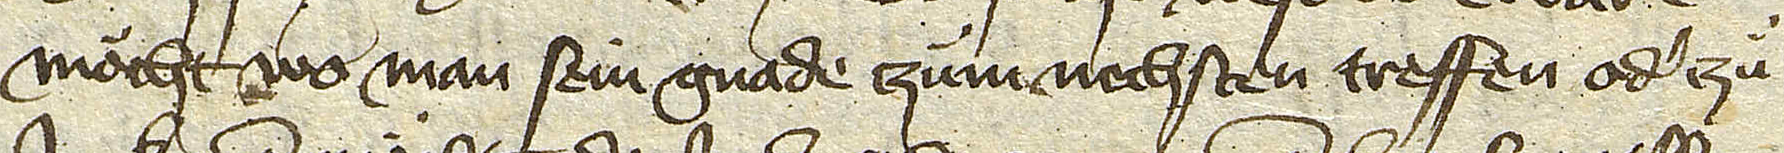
möcht wo man ſein gnade cʒüm nechſten treffen od* cʒü
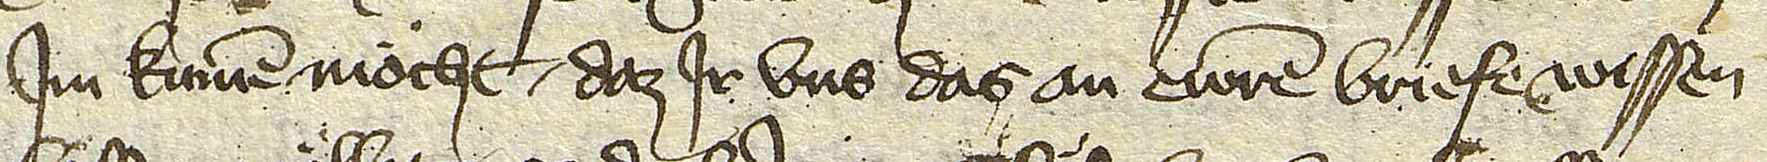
Im kume* möcht / daʒ Ir vns das an ewre* briefe wiſſen
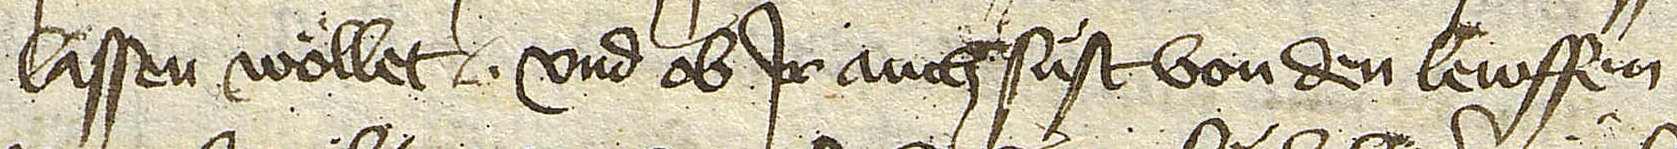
laſſen wöllet / . vnd ob Ir auch ſüſt von den lewffen
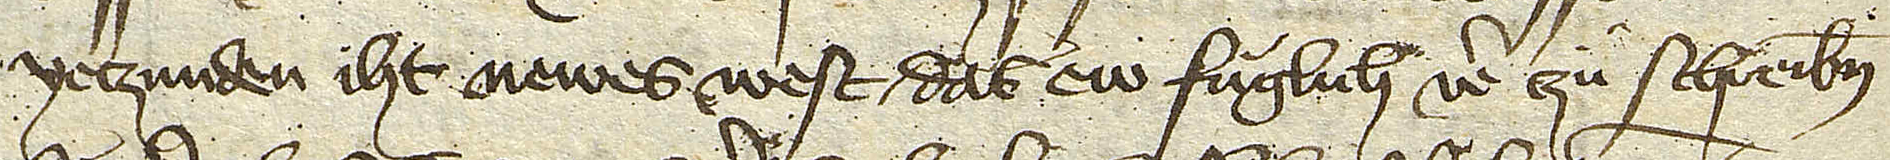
yecʒunden iht newes weſt / das ew füglich w* cʒü ſchreibn*
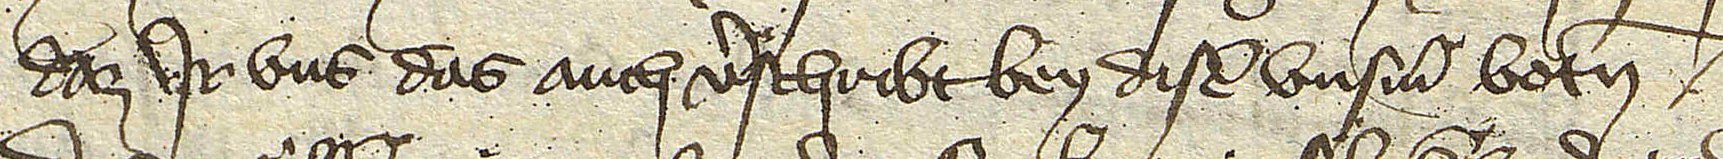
daʒ Ir vns das auch v*ſchribt bey diſe* vnſm* botn* /
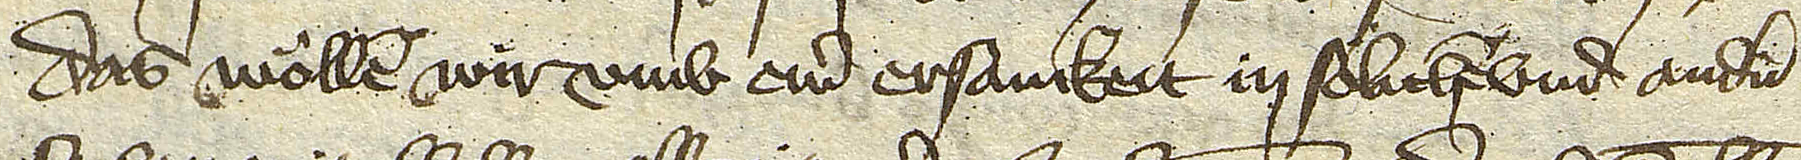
Das wölle* wir vmb ew* erſamkeit in ſöliche* vnd andn*
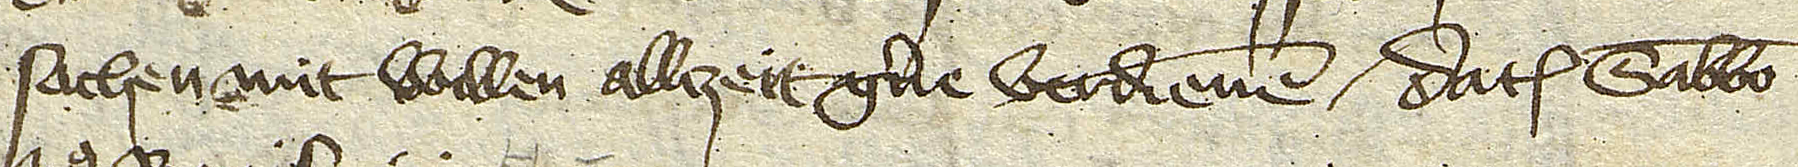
ſachen mit willen allcʒeit g*ne verdiene* / Dat* Sabbo*
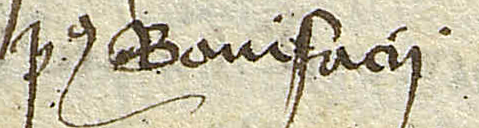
p* Bonifacii*
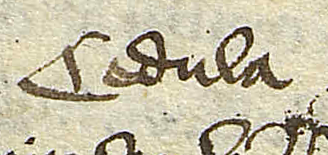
Cedula
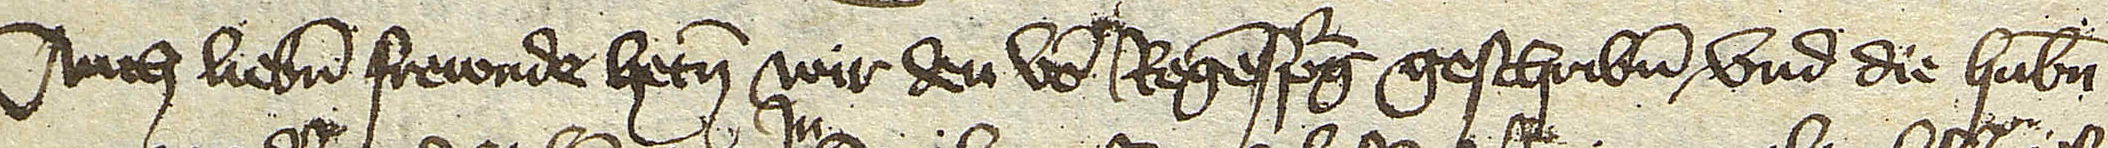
Auch liebn* frewnde hetn* wir den vo* Regeſ*p*g geſchribn* / vnd die habn*
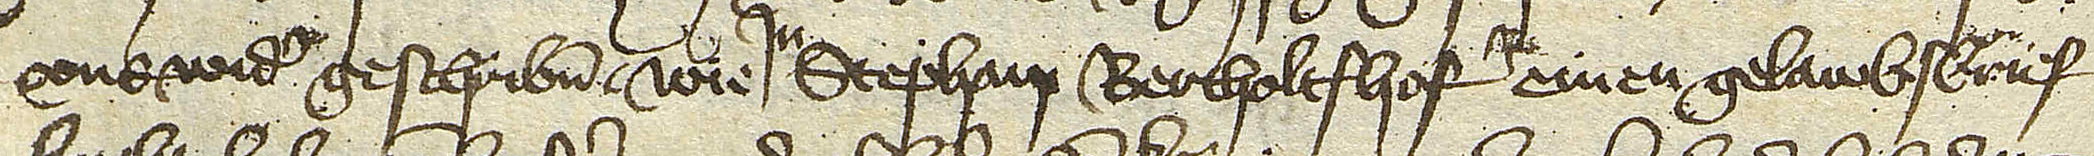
vns wid* geſchribn* / wie Stephan Bertholtſhof* einen gelawbſbrief
